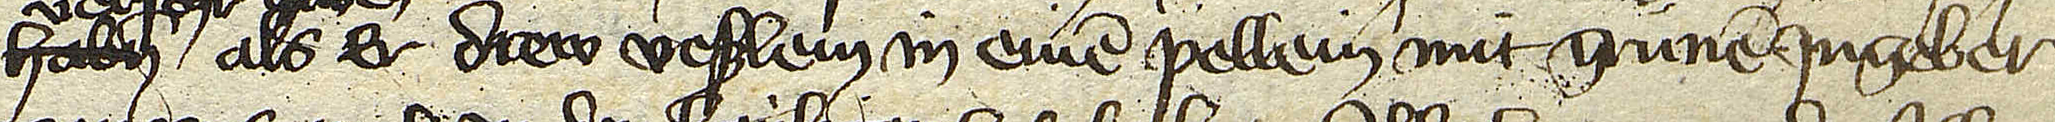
habn* als Er drew veſʒlein in eine* pellein mit grüne* Ingeber
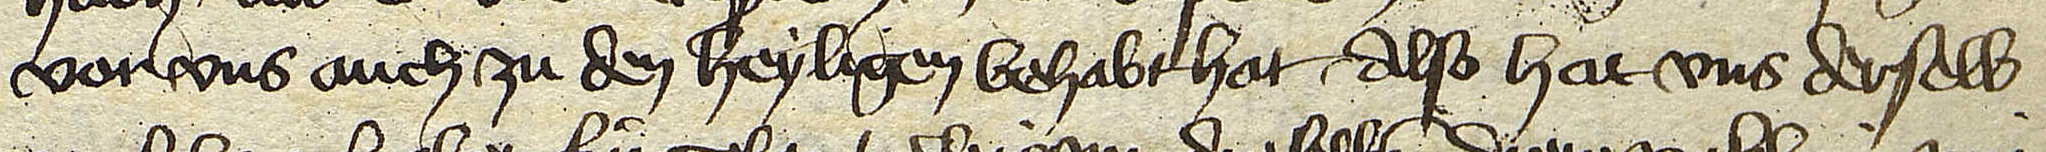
vor vns auch cʒu den heyligen behabt hat / Alſo hat vns derſelb
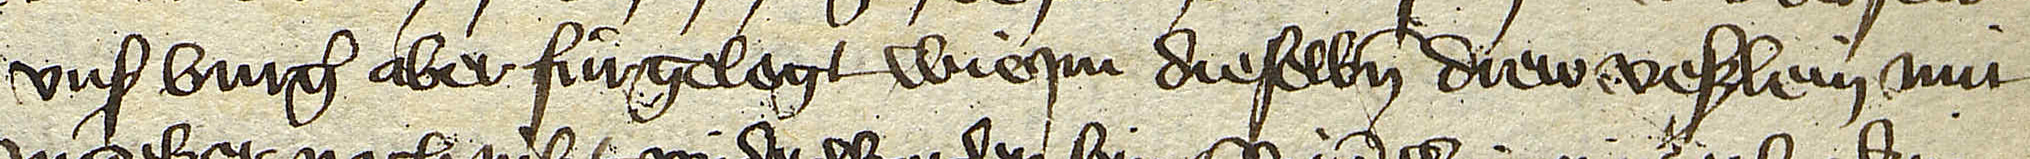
vnſ* burg* aber fürgelegt wie Im dieſelbn* drew veſʒlein mit
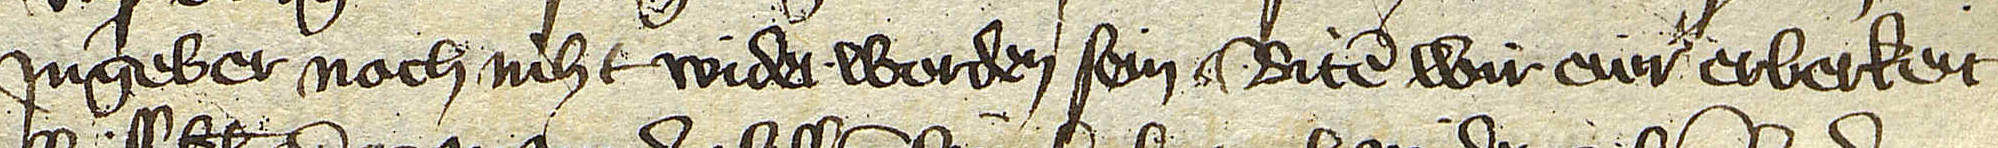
Ingeber noch niht wider worden ſein / Bite* wir ewr erberkeit
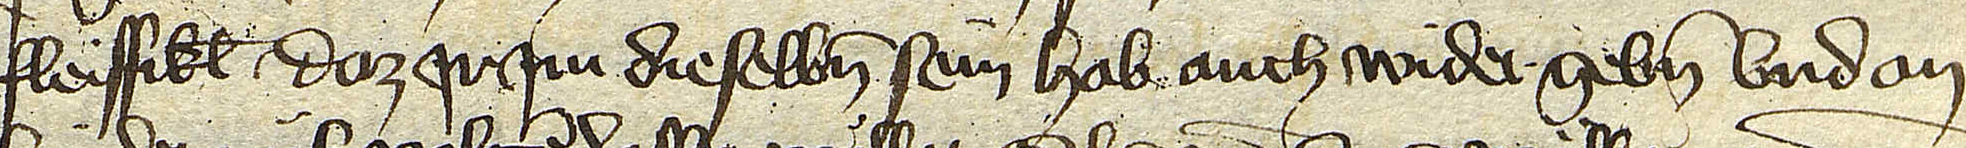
fleiſſikl* / daʒ Ir Im dieſelbn* ſein hab auch wider gebn* vnd on
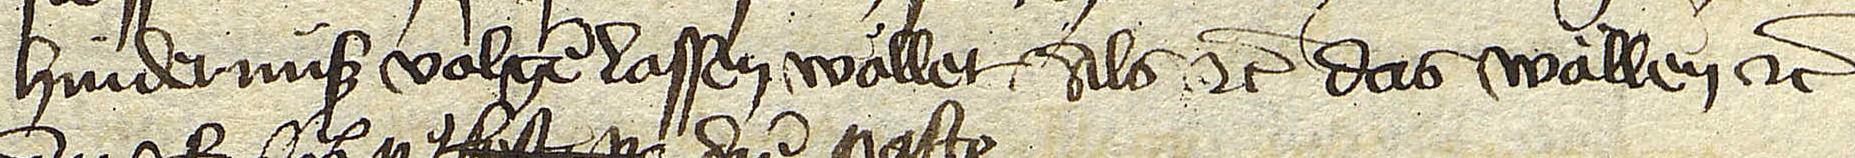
hindernüſʒ volge* laſſen wöllet / Als ec* das wöllen ec*
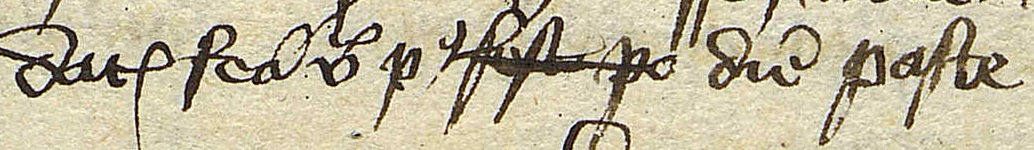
dat* fea* v* p* feſt pa die* paſce
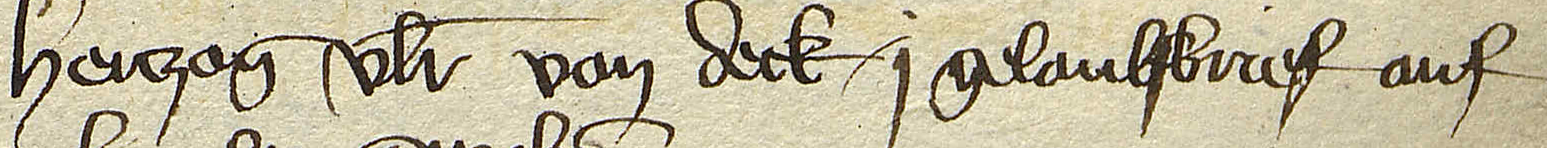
hercʒog vlr* von deck* / i gelaubſbrief auf
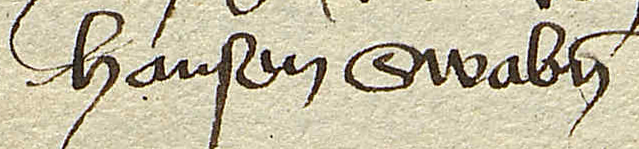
hanſen Swabn*
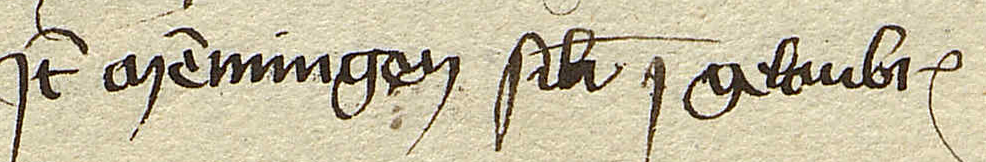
It* Mem*ingen ſilr* i gelaubr*
